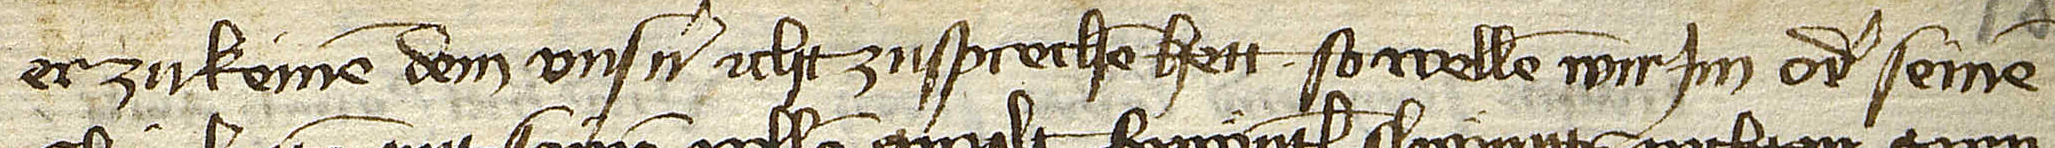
er ʒu keine* dem vnſ*n icht ʒuſpreche* hett . ſo welle* wir Im od* ſeine*
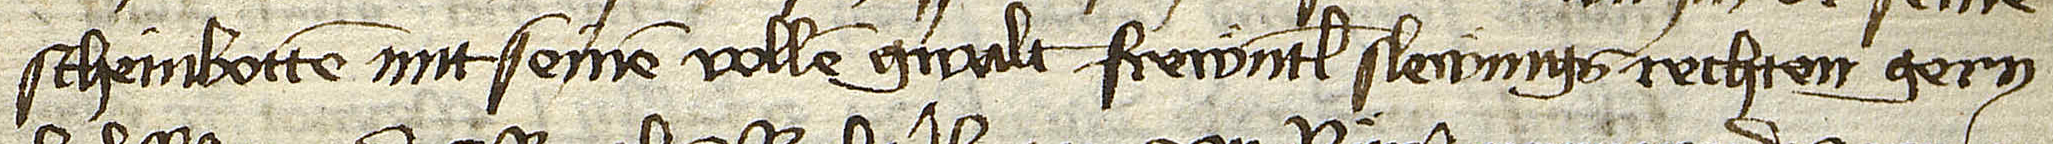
ſcheinbotte* mit ſeine* volle* gwalt frewntl* ſlewnigs rechten gern
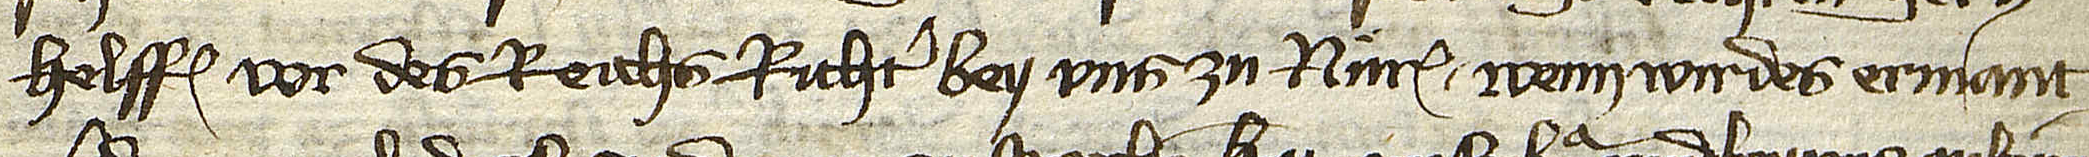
helff* vor des Reichs Richt* bey vns ʒu Nür* / wenn wir des ermant
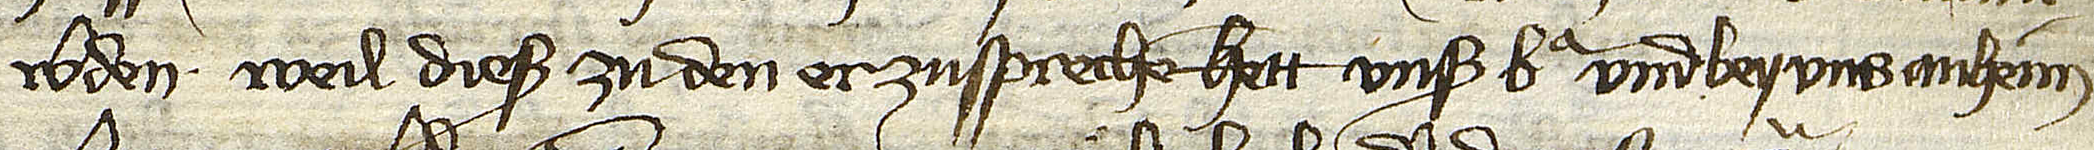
w*den . weil dieſ* ʒu den er ʒuſpreche* hett vnſ* b* vnd bey vns anheim
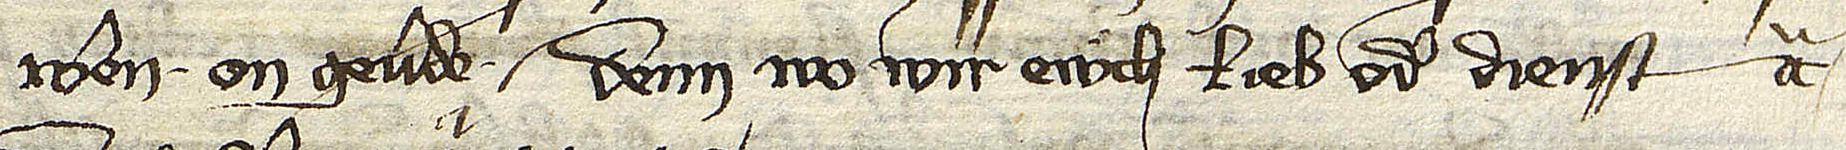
w*en . on geu*de . / Denn wo wir ewch lieb od* dienſt ec*
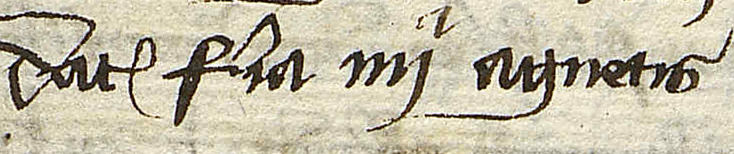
Dat* fia* iiii* agnetis
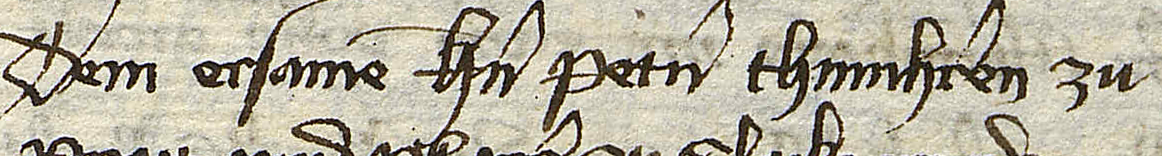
Dem erſame* h*n Pet*n thumh*ren ʒu
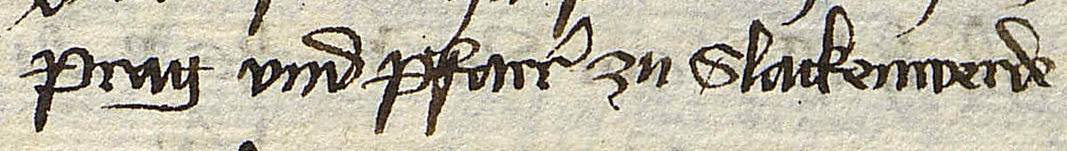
Prag vnd Pfarr* ʒu Slakenwerde
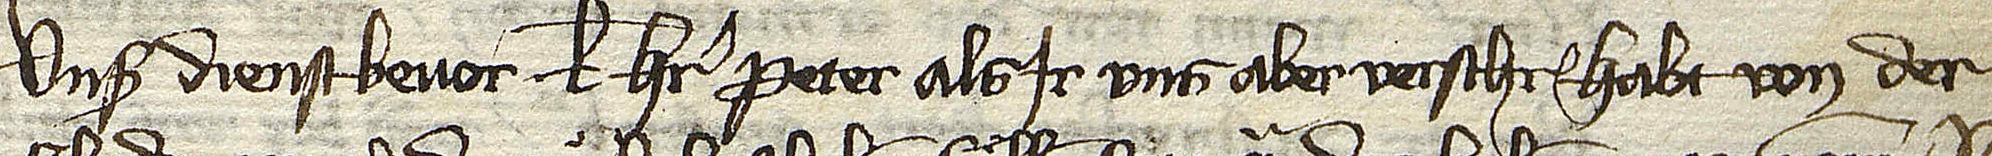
Vnſ* dienſt beuvor l* h*r Peter als Ir vns aber verſchr* habt von der
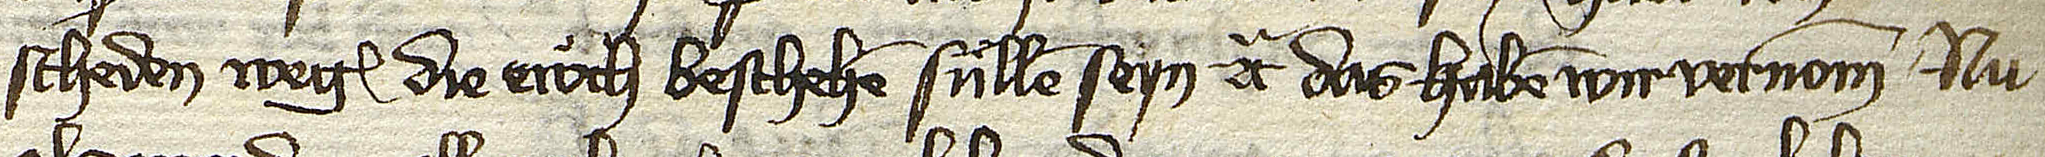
ſcheden weg* die ewch beſchehe* ſülle* ſein ec* das habe* wir vernom* / Nu
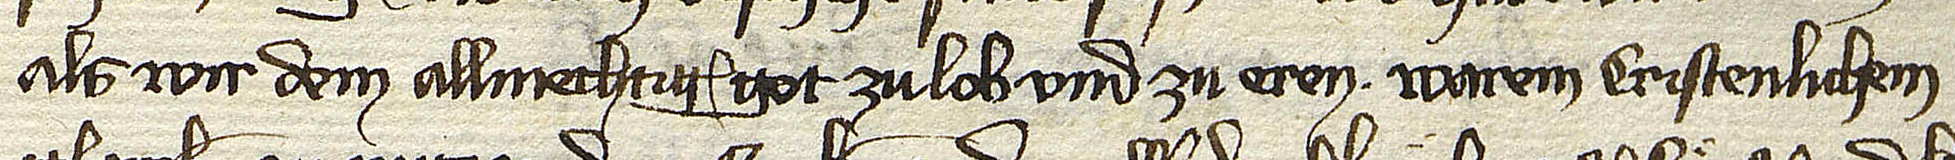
als wir dem allmechtig* got ʒu lob vnd ʒu eren . warem Criſtenlichem
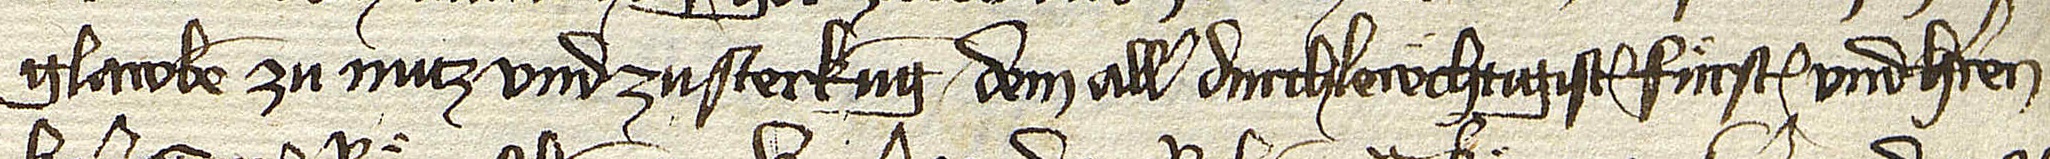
glawbe* ʒu nucʒ vnd ʒuſterku*g / dem all* durchlewchtigiſt* fürſt* vnd h*ren
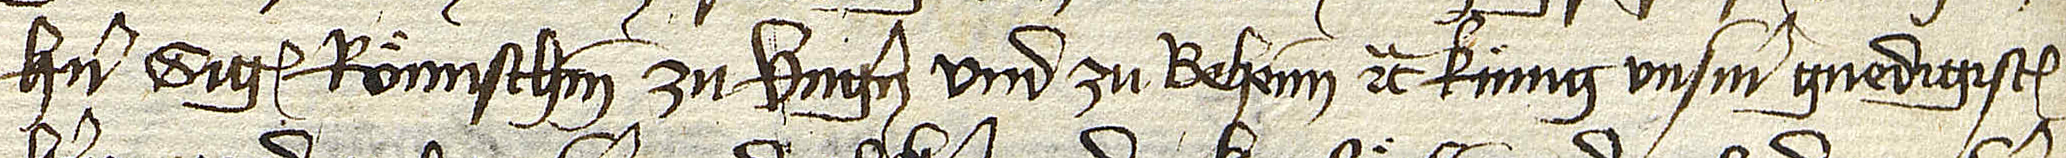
h*n Sig* Römiſch*m ʒu Vng*n vnd ʒu Beheim ec* künig vnſ*m gnedigiſt*
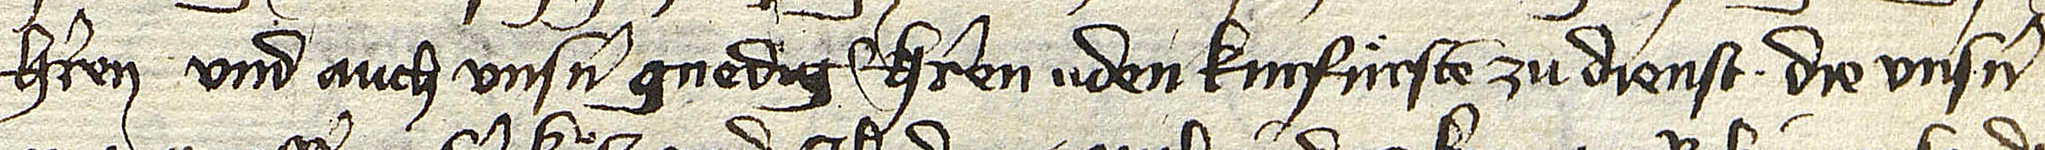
h*ren vnd auch vnſ*n gnedig* h*ren ~ den kurfürſte* ʒu dienſt . die vnſ*n
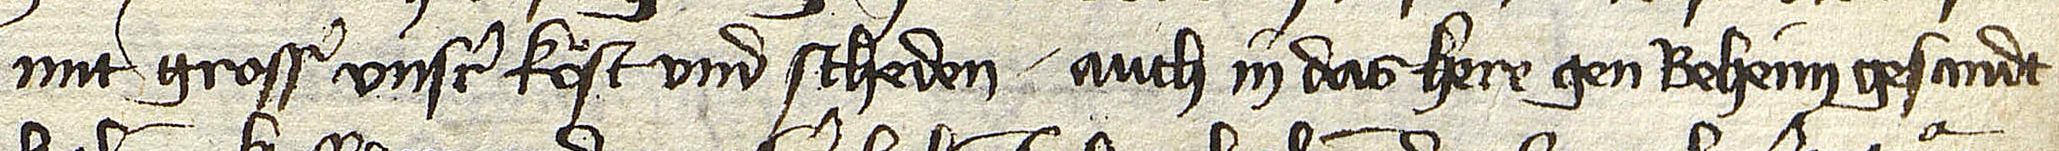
mit groſſ* vnſ*r köſt vnd ſcheden / auch in das here gen Beheim geſandt
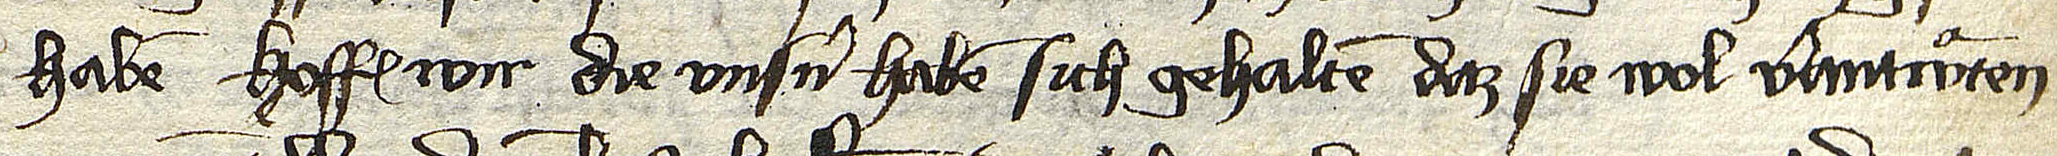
habe* hoff* wir die vnſ*n habe* ſich gehalte* daʒ ſie wol v*antw*ten
